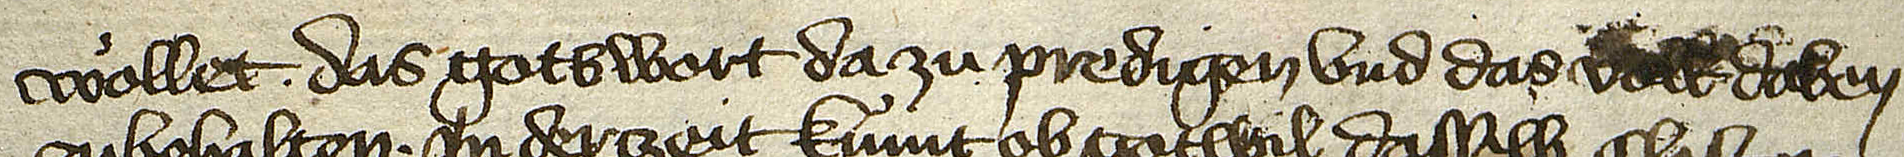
wöllet . das gotswort da ʒu predigen vnd das volk dabey
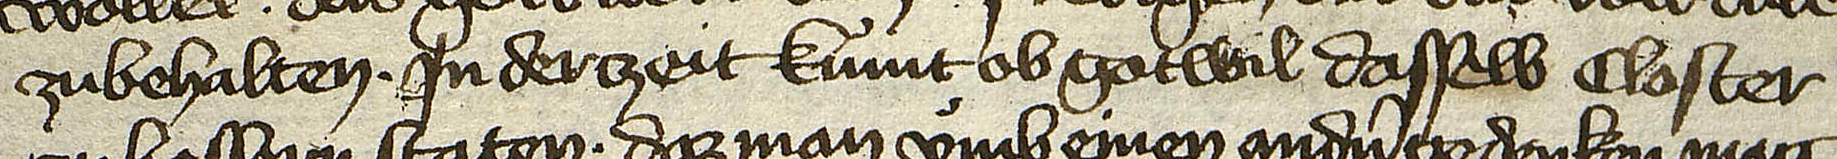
ʒubehalten . In dercʒeit kümt ob got wil daſſelb Cloſter
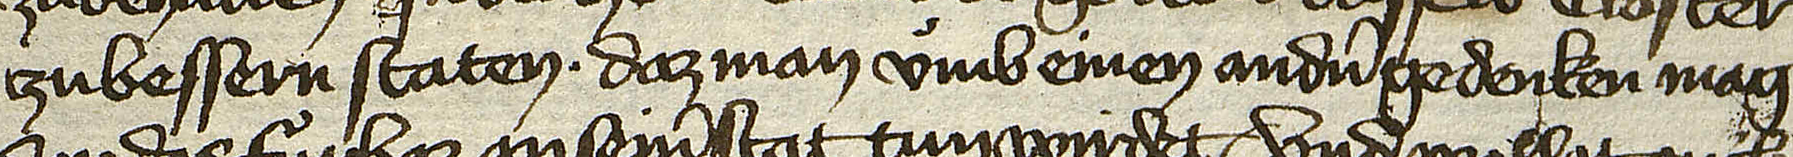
cʒu beſſern ſtaten . daʒ man v̈mb einen and*n gedenken mag*
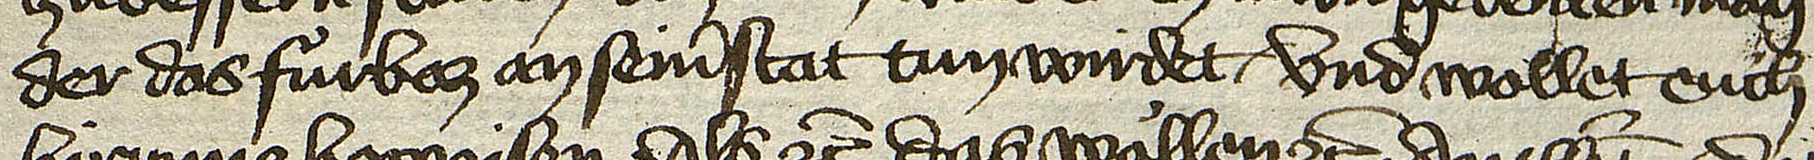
der das fürbaʒ an ſein* ſtat tun wirdet / Vnd wollet euch
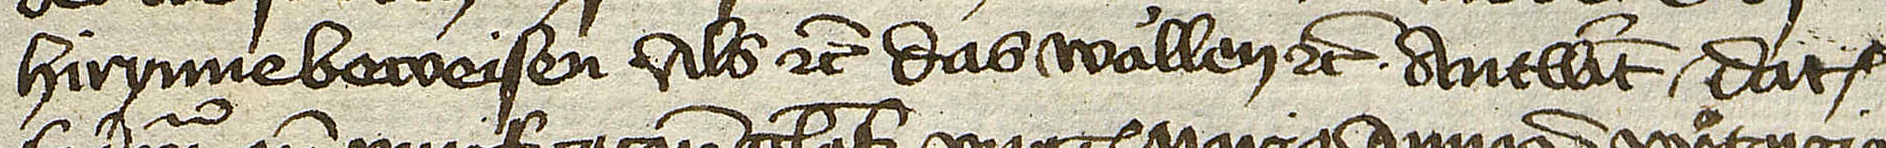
hirynne beweiſen Als ec* das wöllen ec* . Antw*t / Dat*
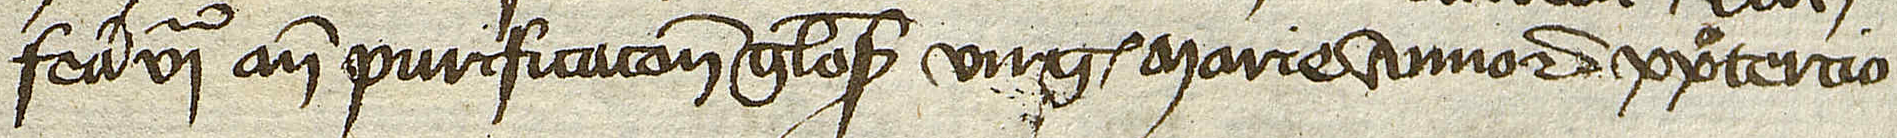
fe*a vi* an* purificacon* gloſ* virg* Marie Anno ec* xx*tercio
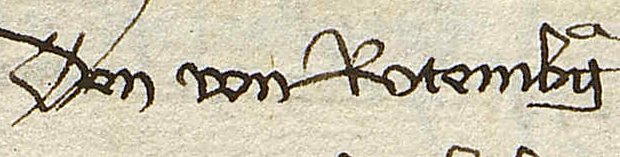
Den von Rotemb*g
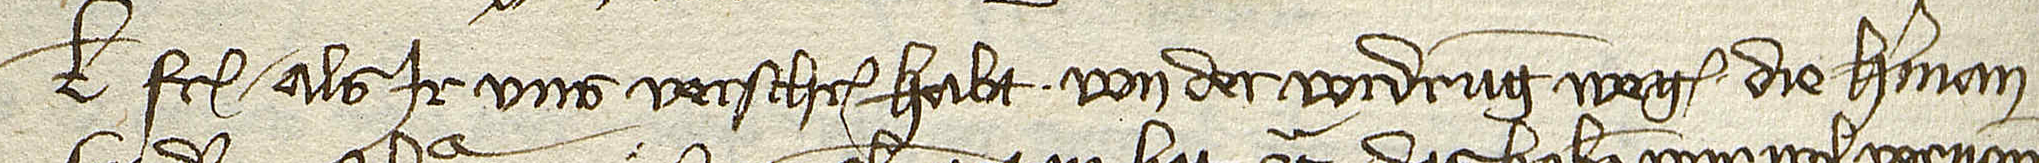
L fr* / als Ir vns verſchr* habt . von der vordr*ug weg* . die h*man
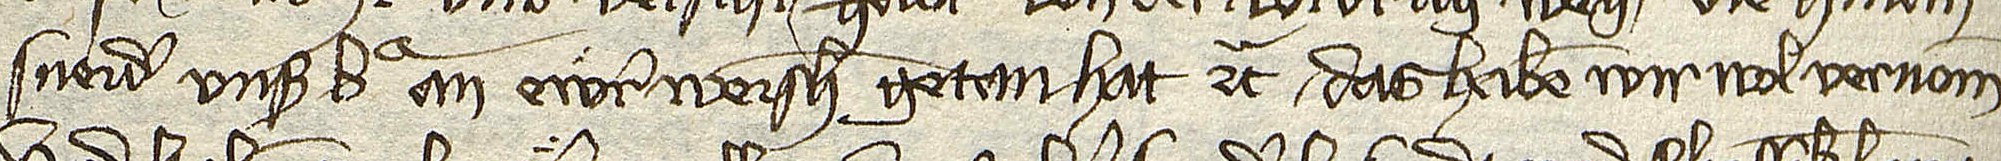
ſneid* vnſ* b* an eẅr* weiſh* getan hat ec* / das habe* wir wol vernom*
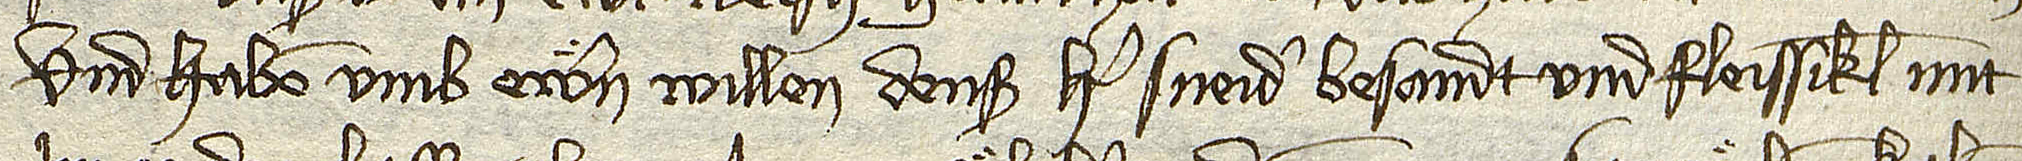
Vnd habe* vmb eẅ*n willen denſ* h* ſneid* beſandt vnd fleiſſikl* mit
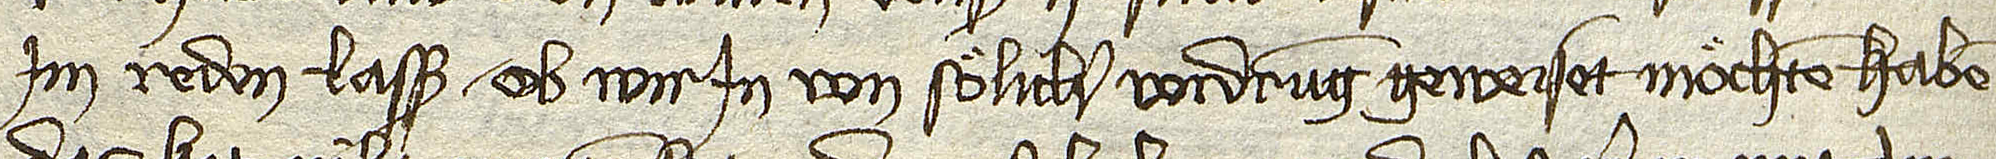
Im reden laſſ* / Ob wir In von ſölich* vordru*g geweiſet möchte* habe*
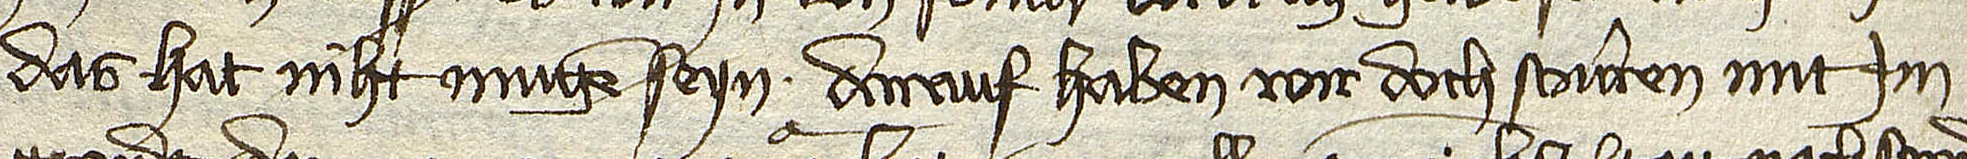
das hat niht mug*e ſeyn . darauf haben wir doch ſou*ren mit Im
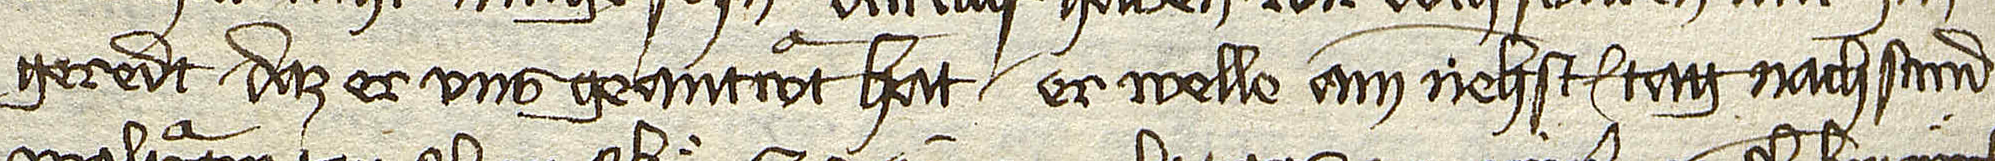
geredt / daʒ er vns geantw*t hat / er welle am* nehſt* tag nach ſand
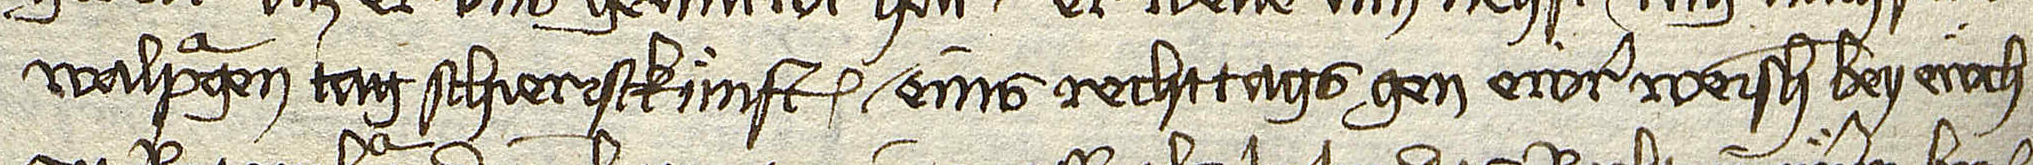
walp*gen tag ſchieriſtkünſt* / eins rechttags gen eẅr weiſh* bey eẅch
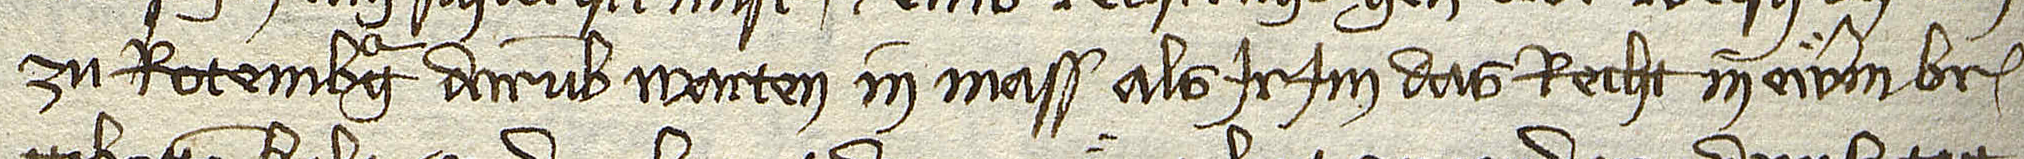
ʒu Rotemb*g darub* warten in maſſ als Ir Im das Recht in eẅ*m br*
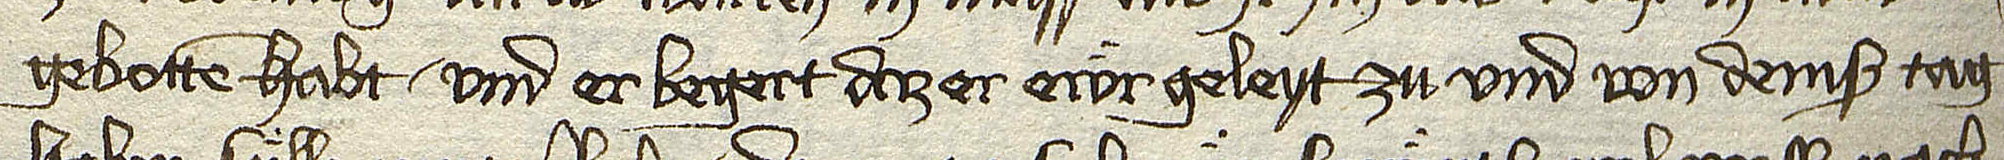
gebotte* habt / vnd er begert daʒ er eẅr geleyt ʒu vnd von demſ* tag
